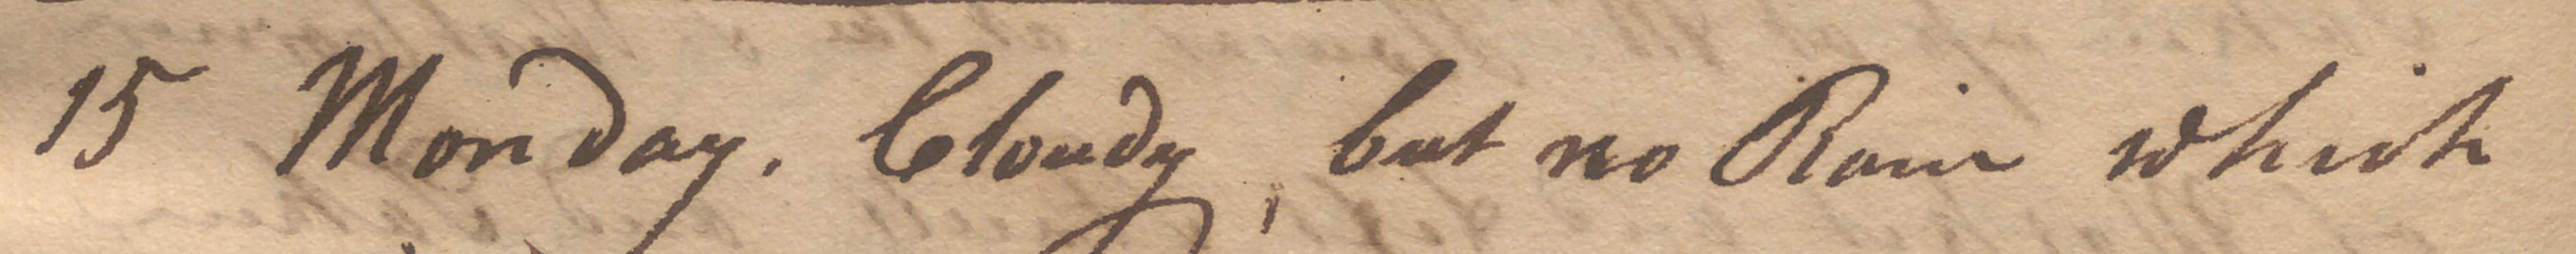15 Monday. Cloudy but no Ram which
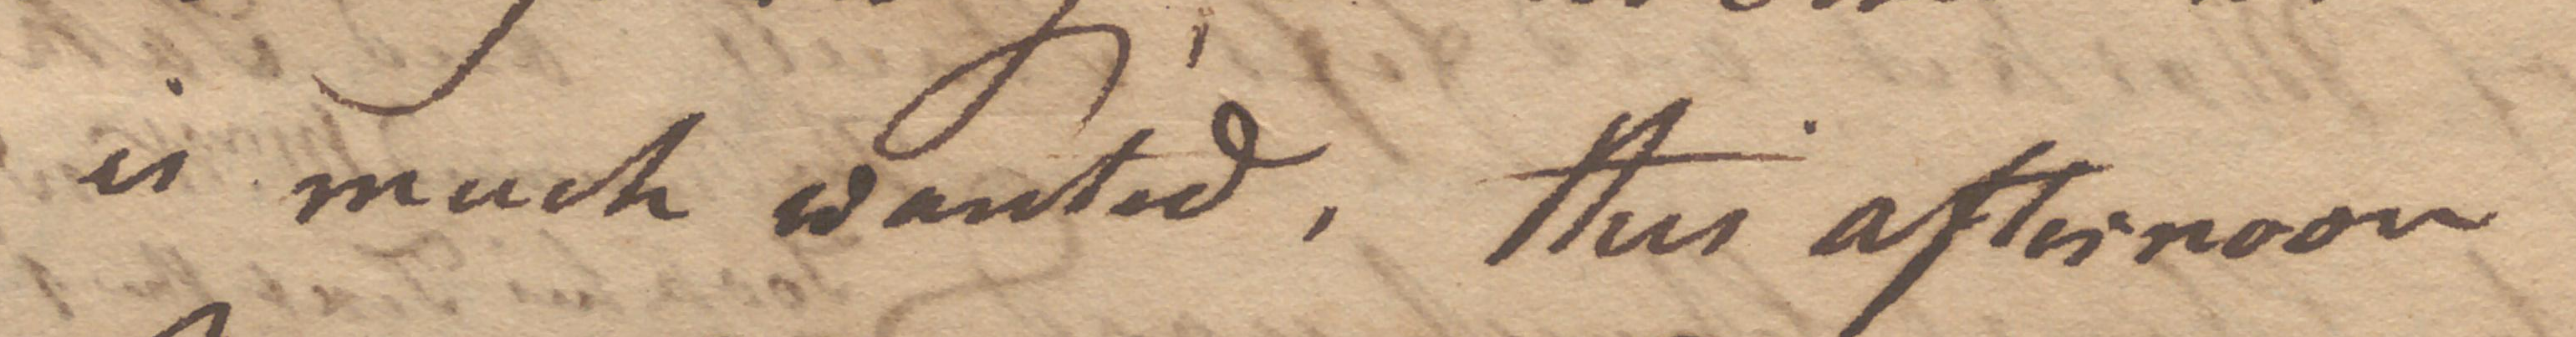is much wanted, this afternoon
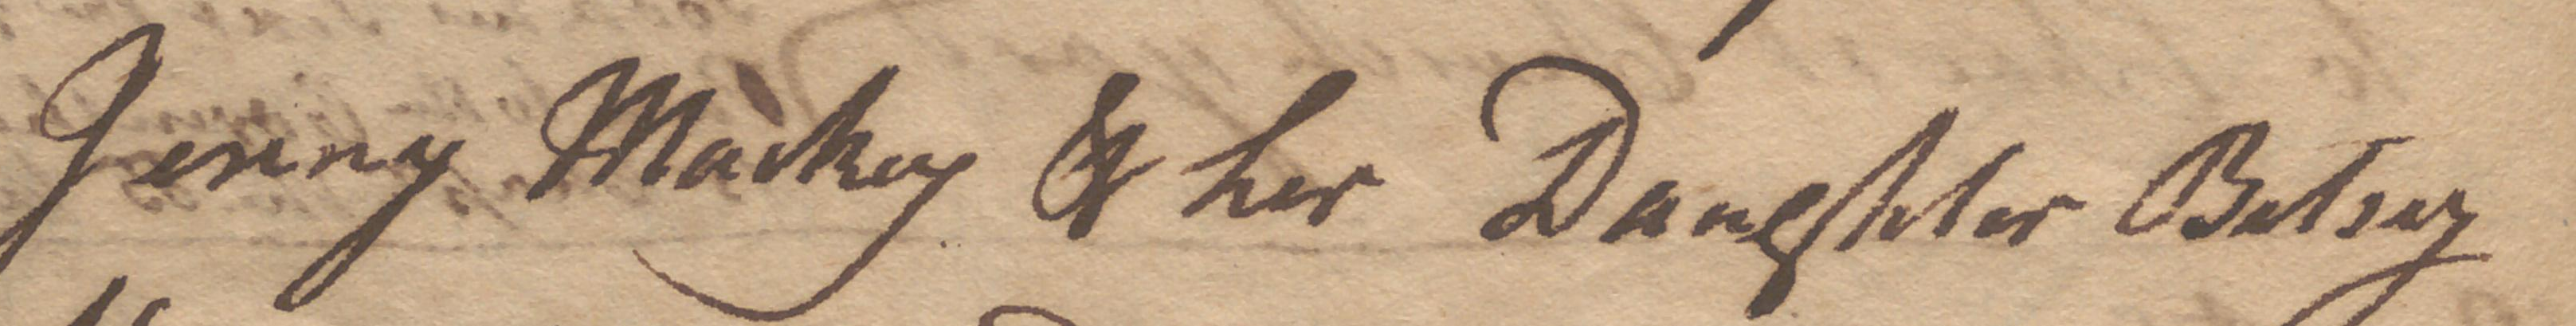Jenny Mackey & her Daughter Betsey
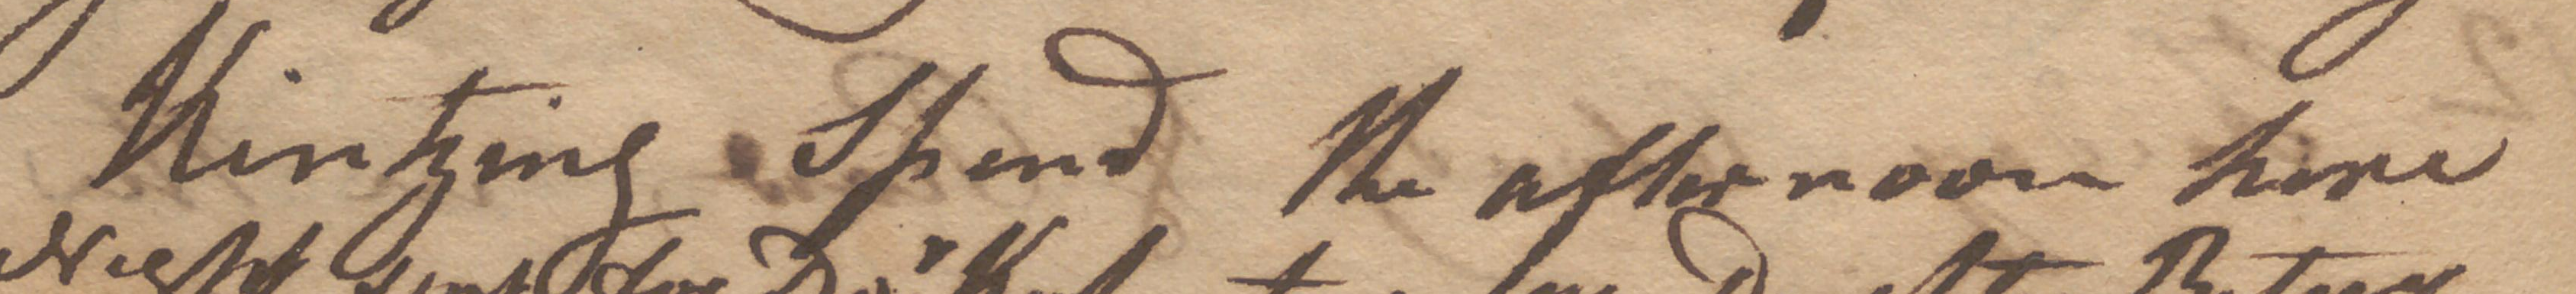Kintzing Spend the afternoon here
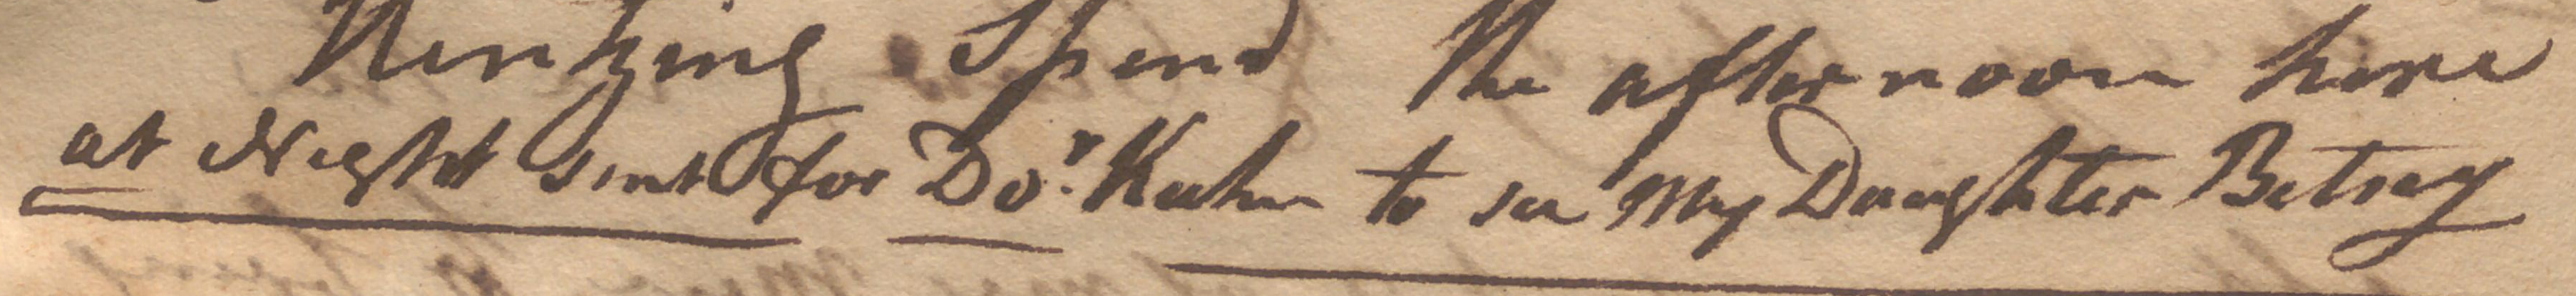at Night sent for Do^r. Kuhn to see My Daughter Betsey
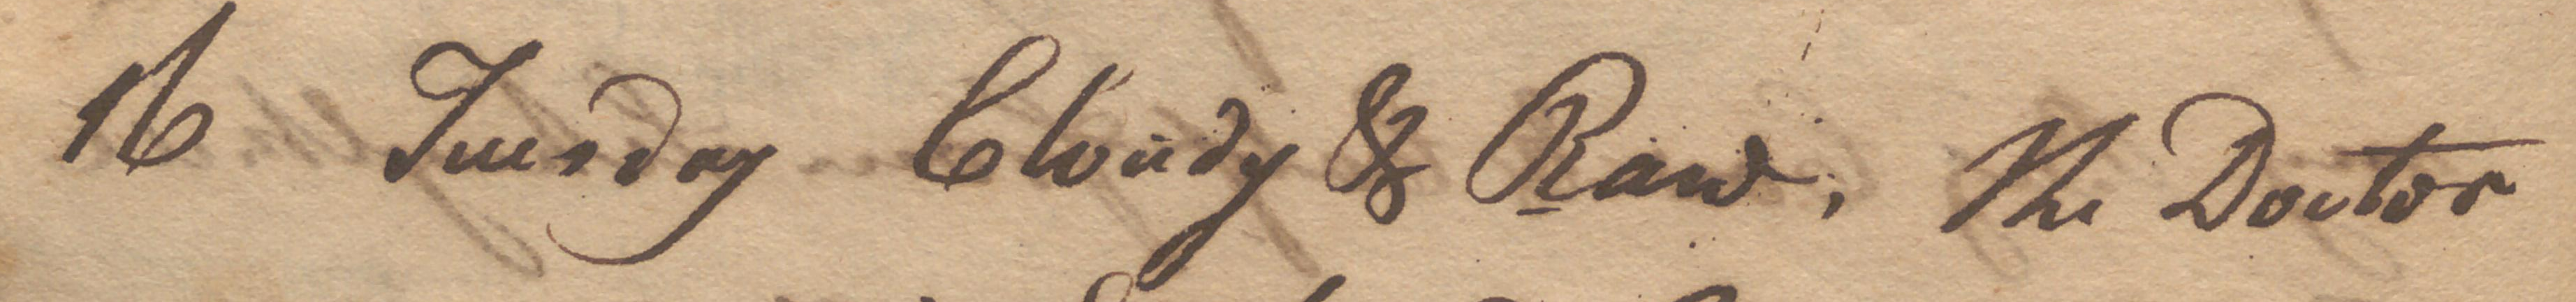16 Tuesday Cloudy & Raw, the Doctor
